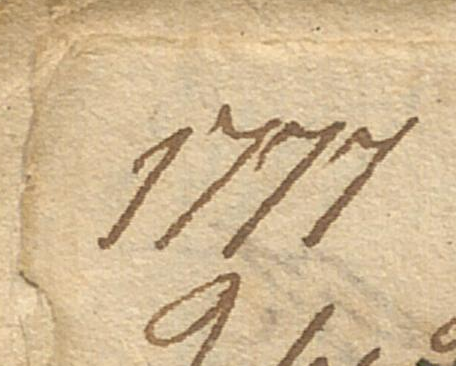1777
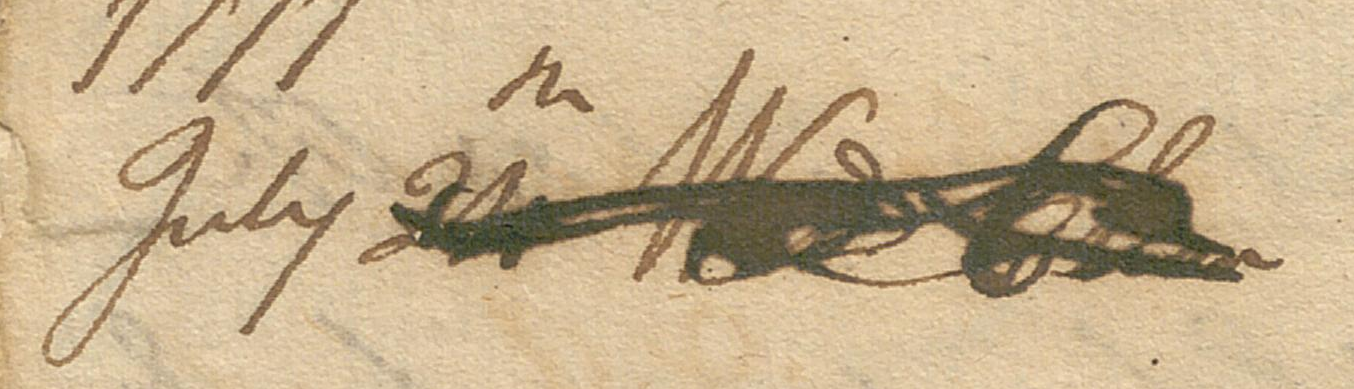July [24^th Wed Clear]
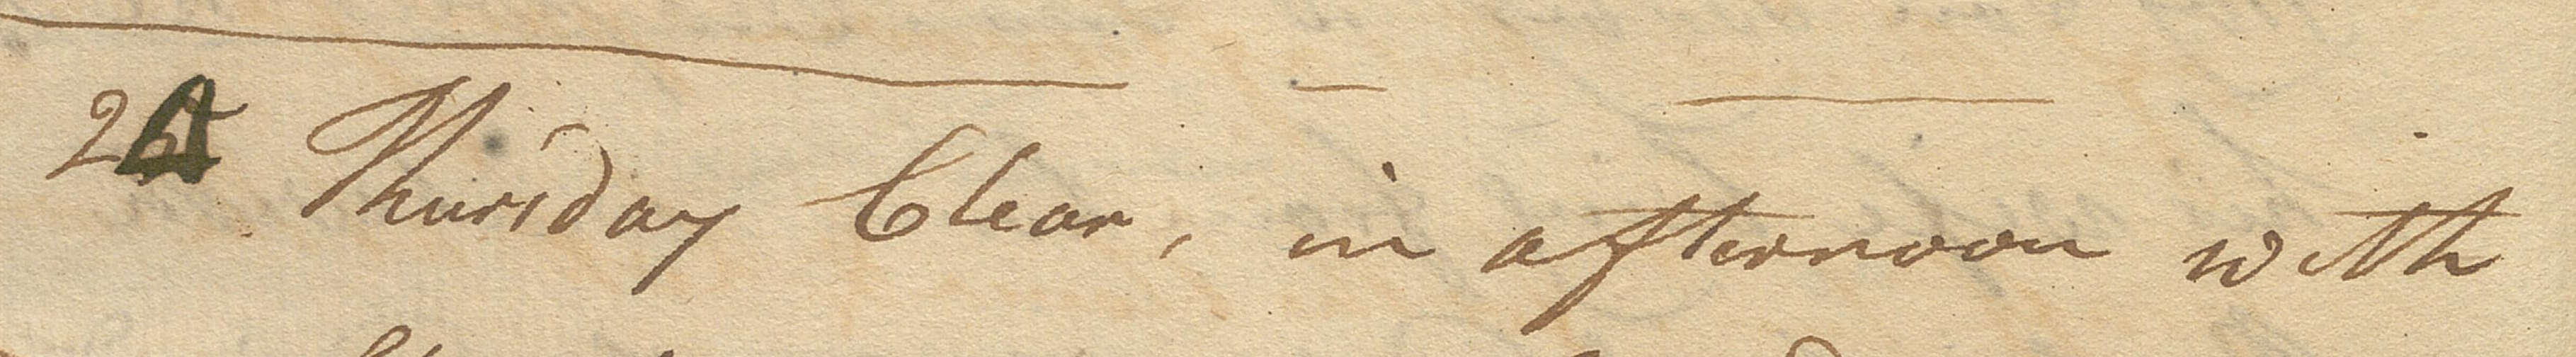24 Thursday Clear, in afternoon with
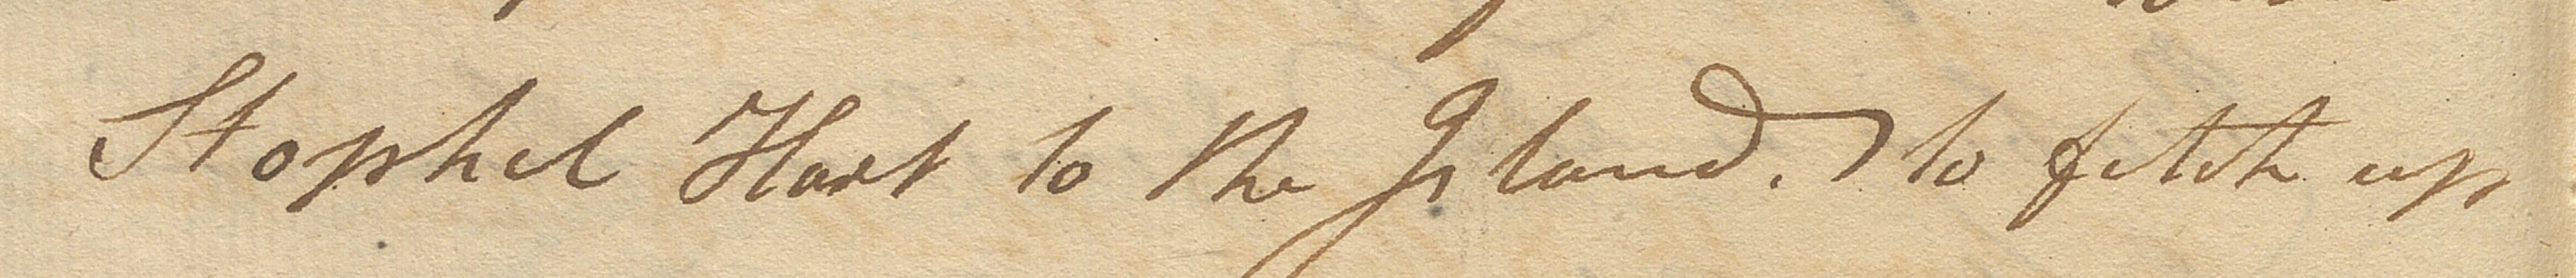Stophel Hart to the Island. to fetch up
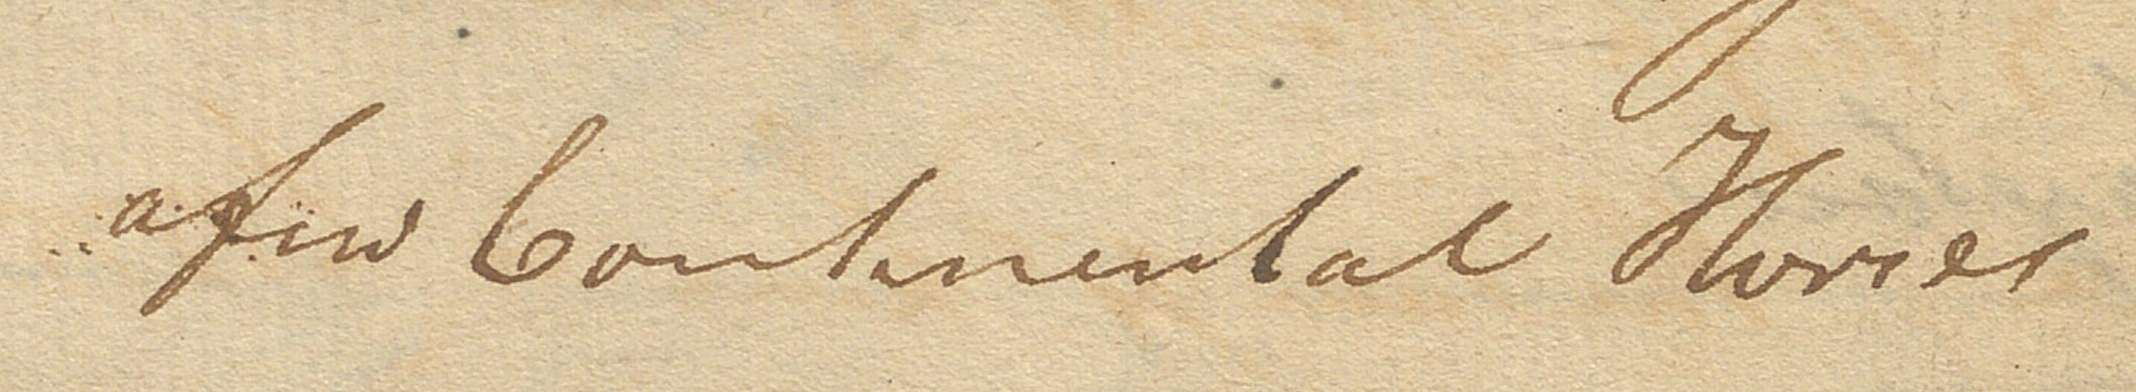a few Continental Horses
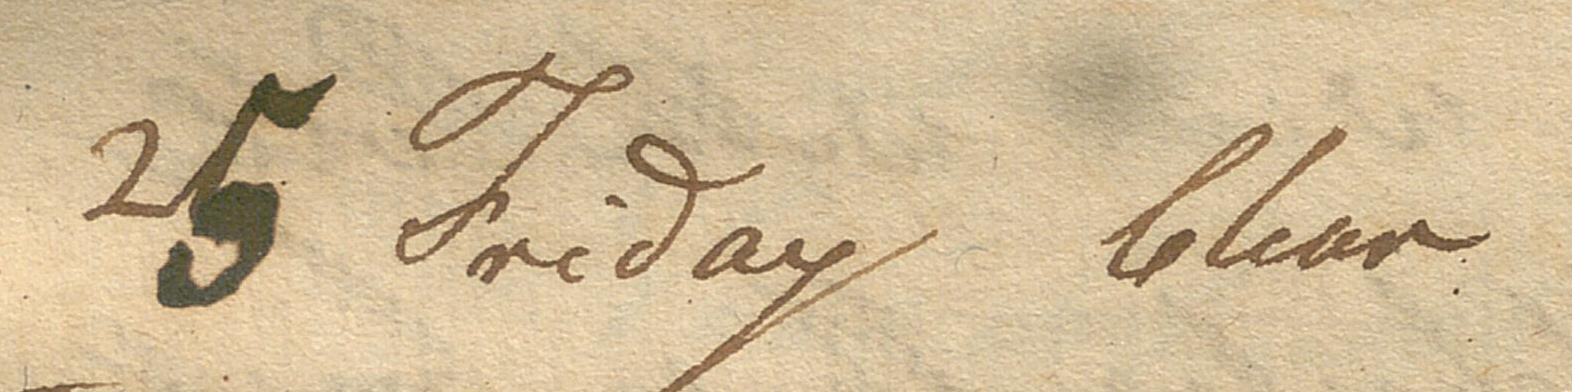25 Friday, Clear
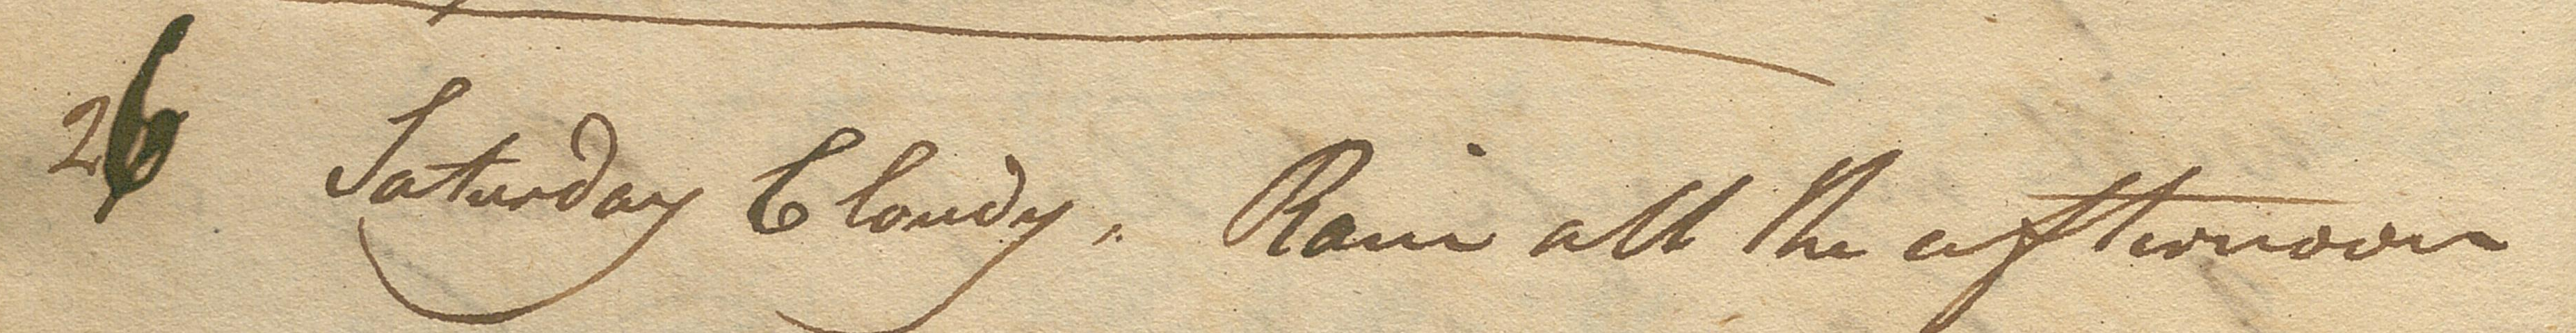26 Saturday Cloudy. Rain all the afternoon
